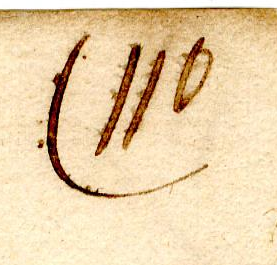110
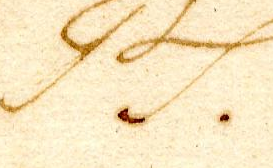PS.
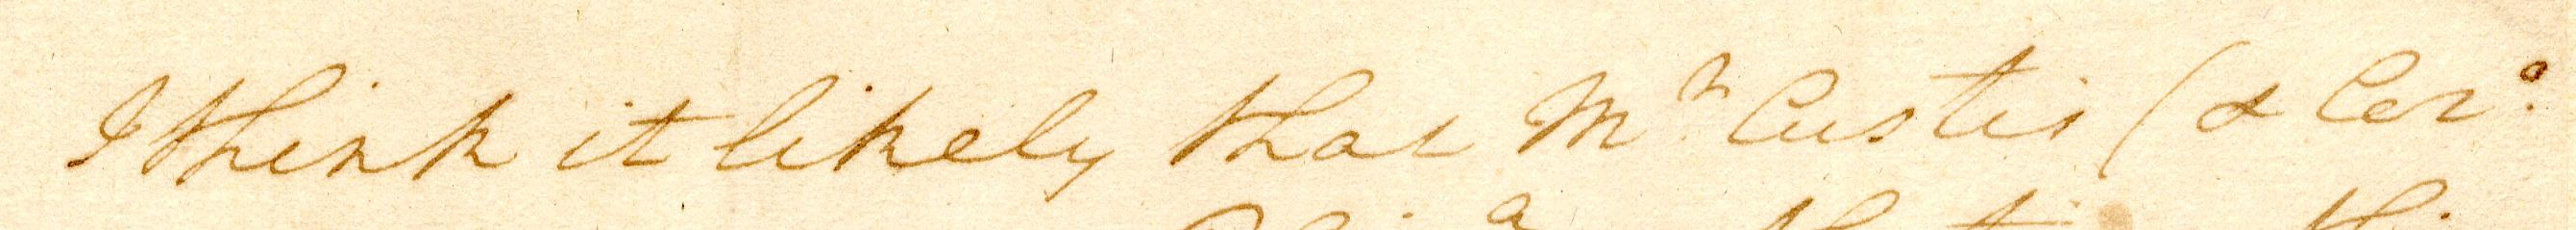I think it likely that M^r Custes (& Cer^o.
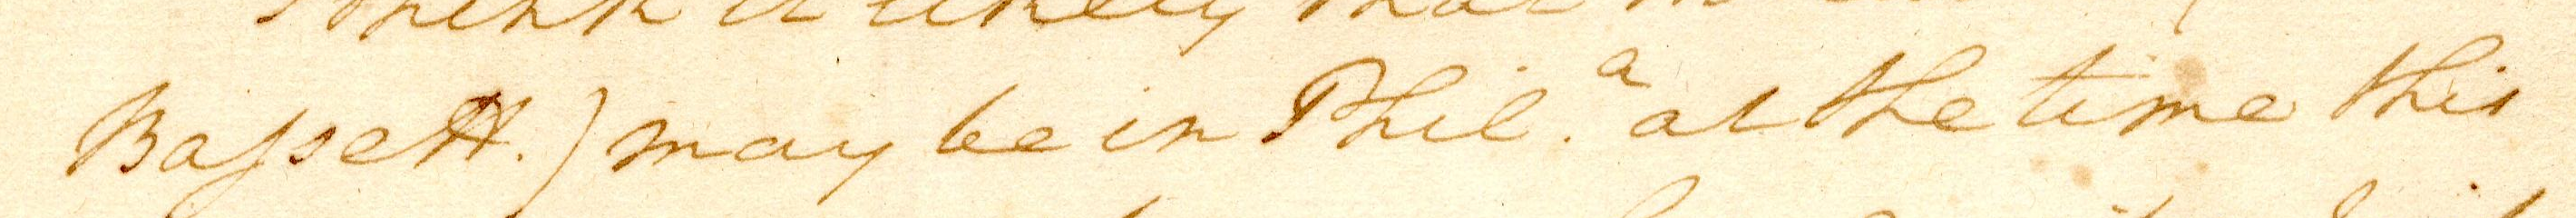Bassett.) may be in Phil^a. at the time this
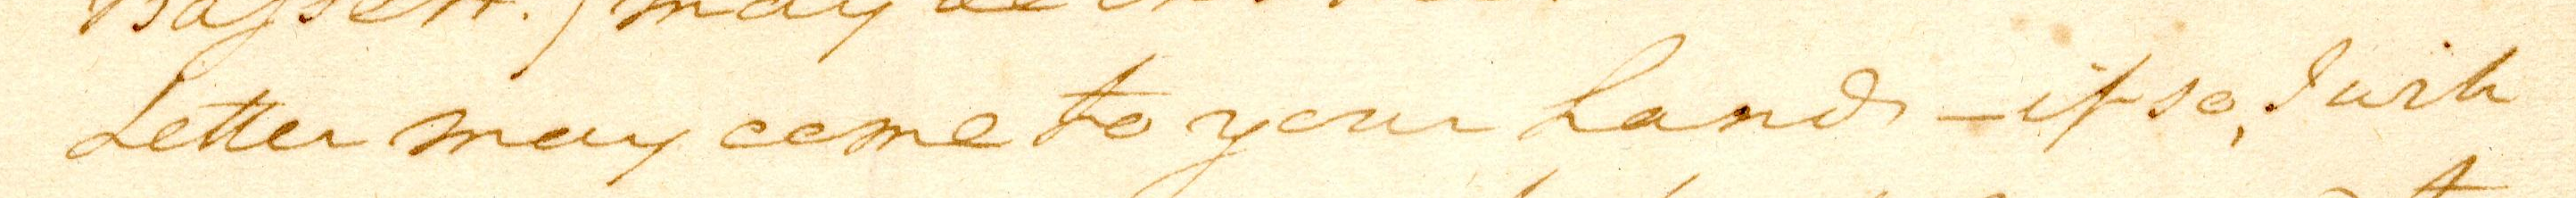Letter may come to your hands- if so I wish
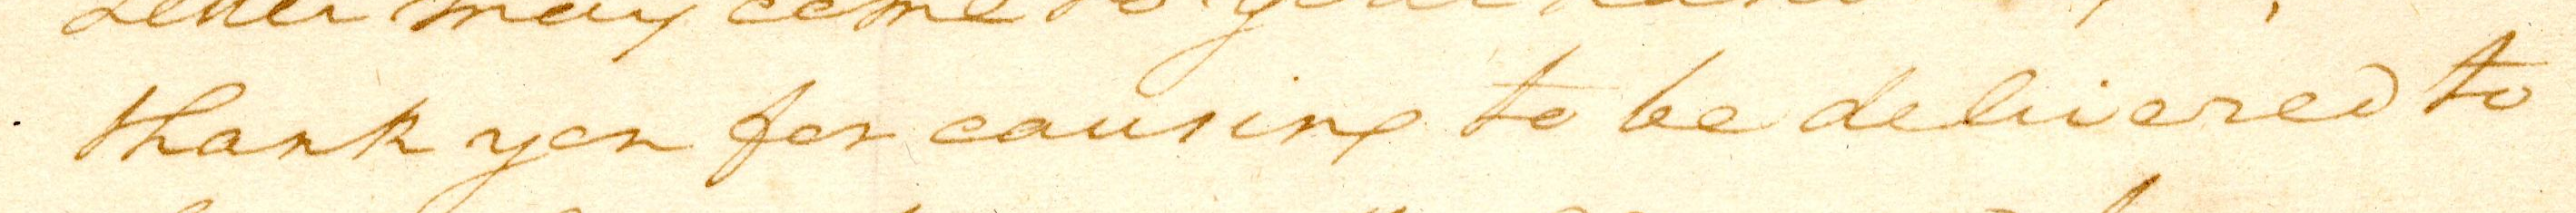thank you for causing to be delivered to
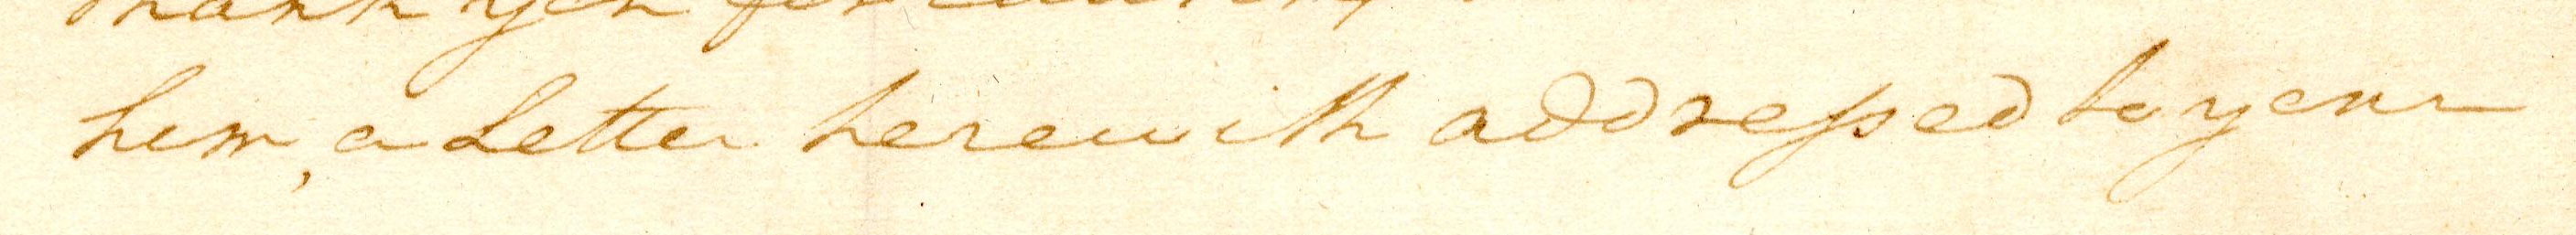him, a Letter here with addressed to your
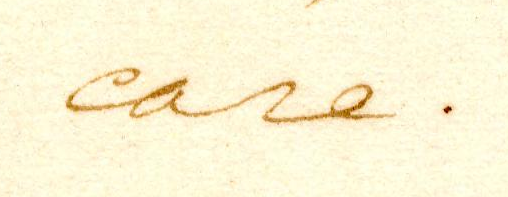care.
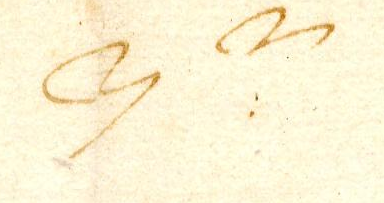Y^r:
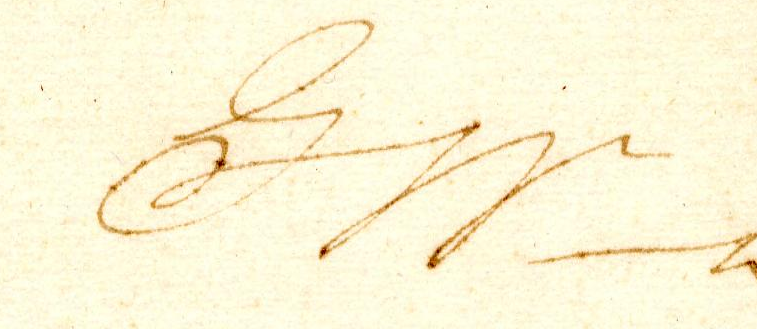GW
